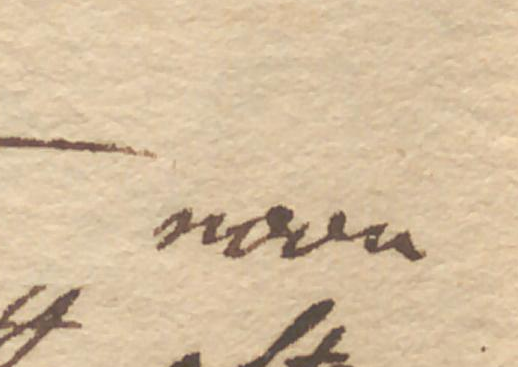noon
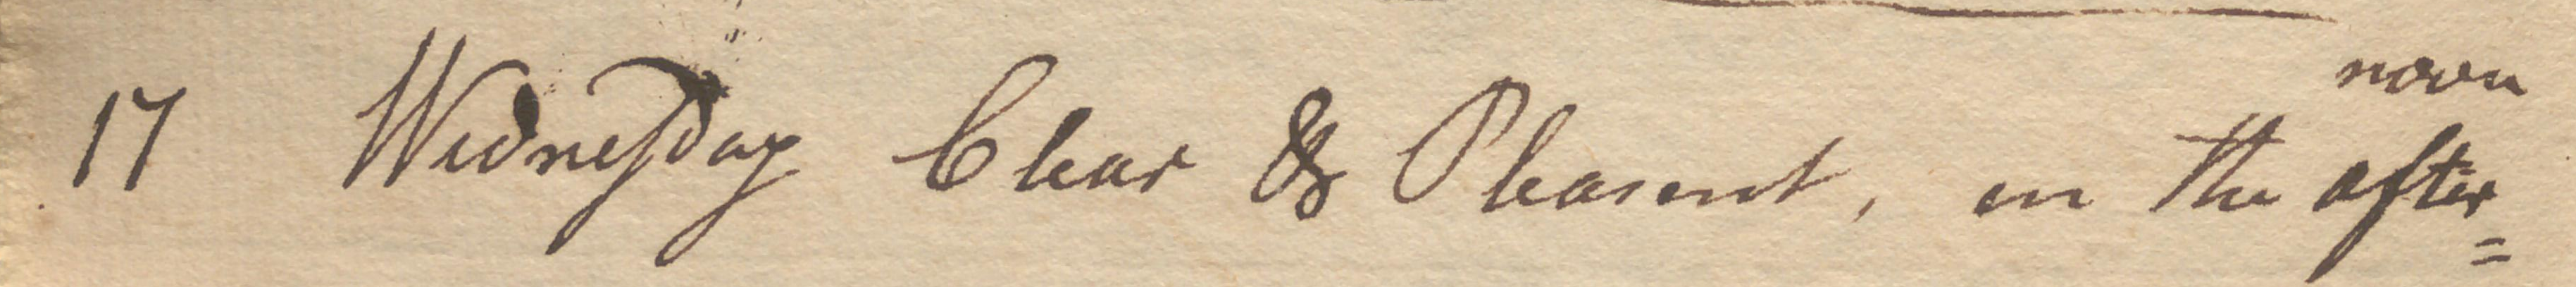17 Wednesday Clear & Pleasent, in the after
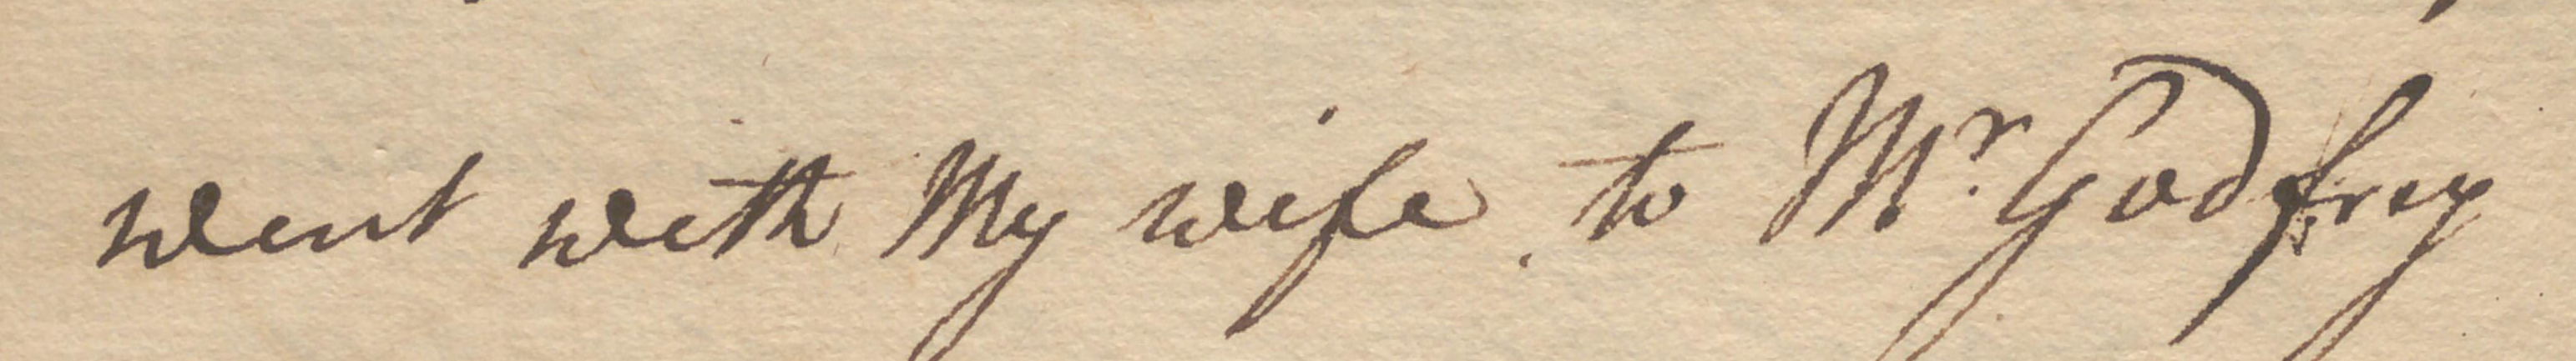went with My wife to M^r Godfrey
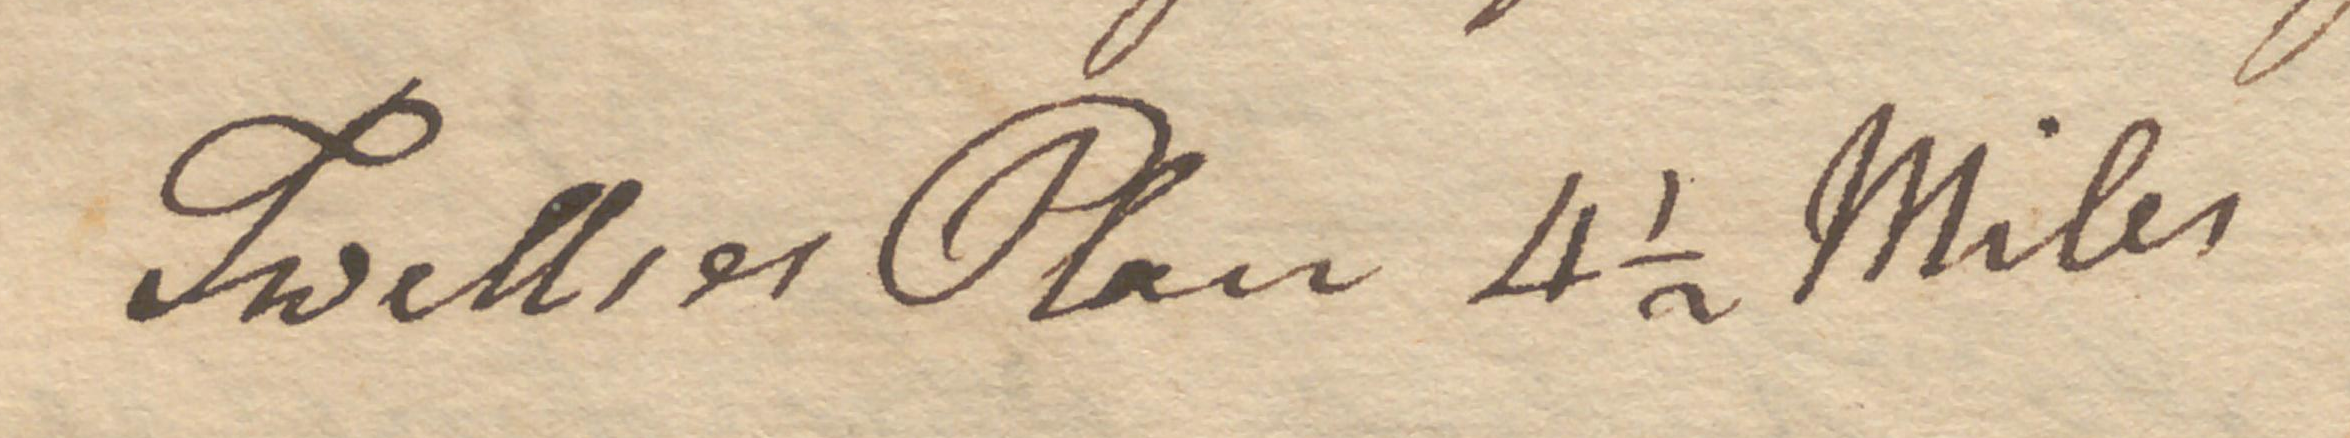Twellses Plac 4 1/2 Miles
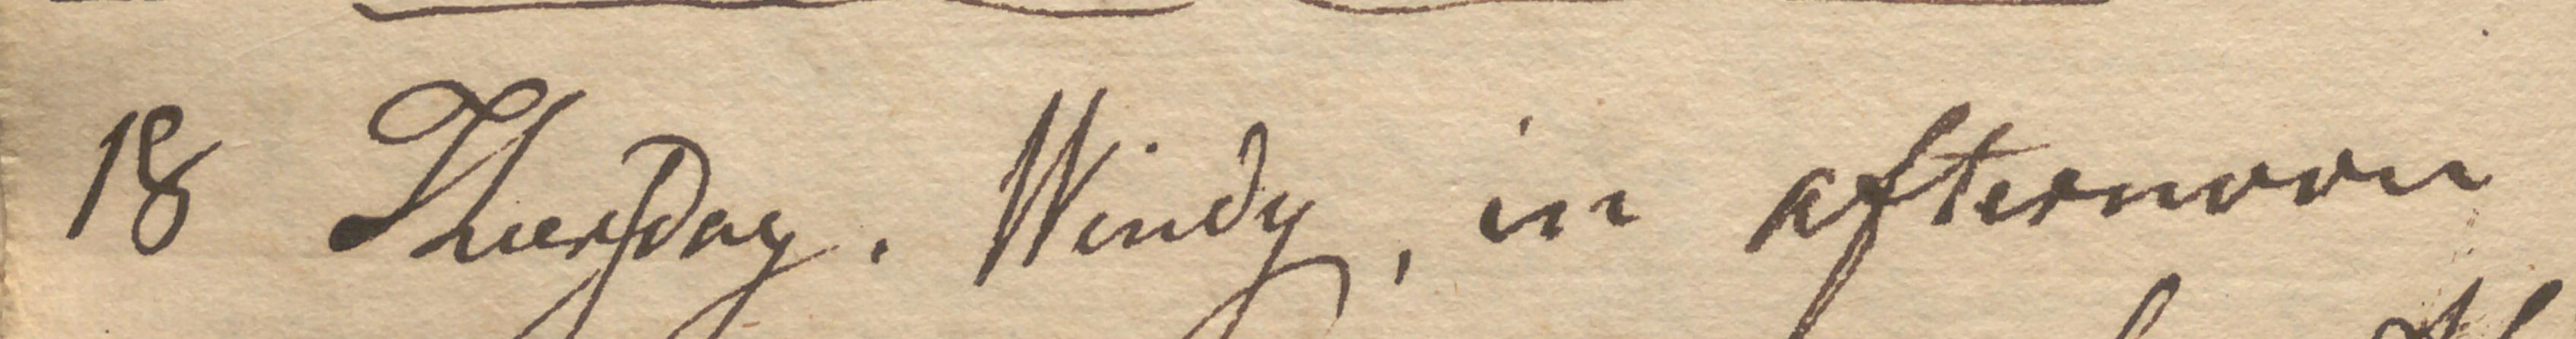18 Thusday. Windy in afternoon
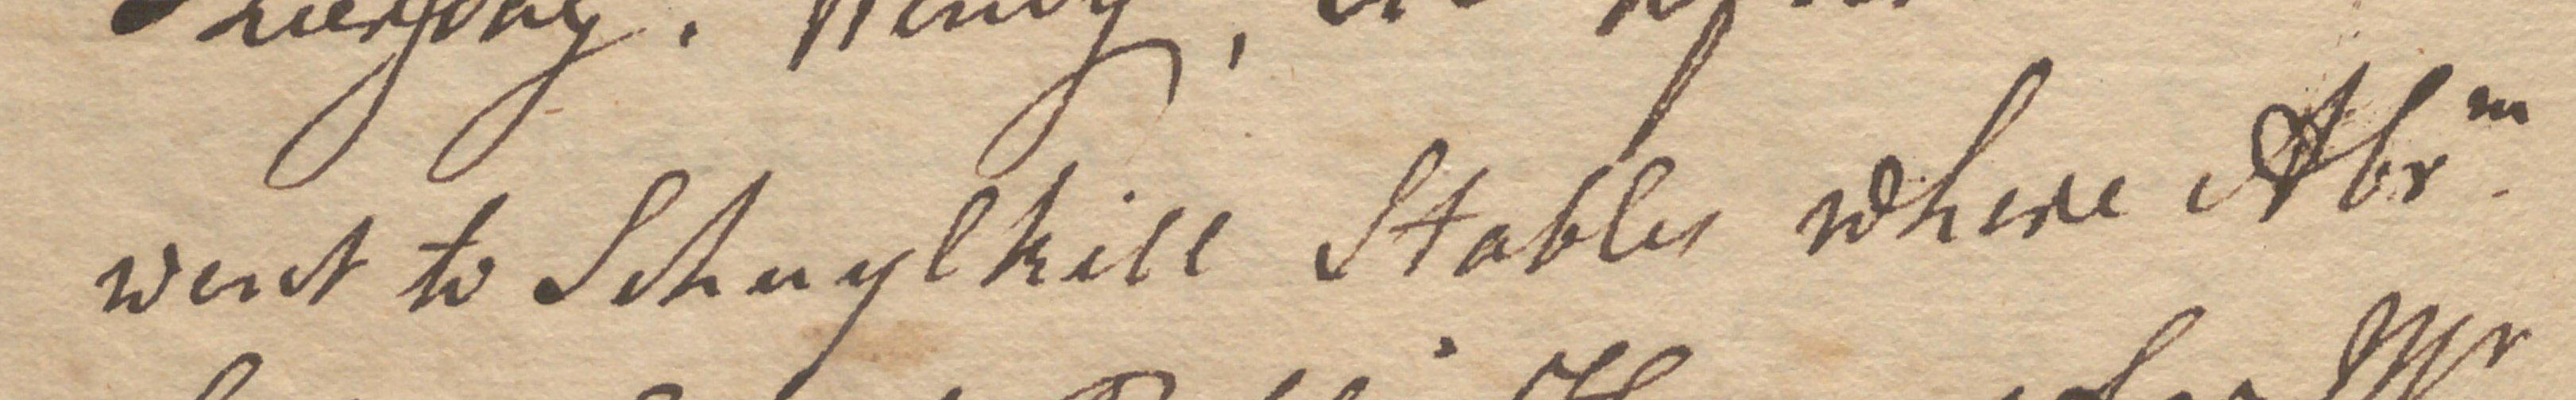went to Schuylkill Stables where Abr^m.
